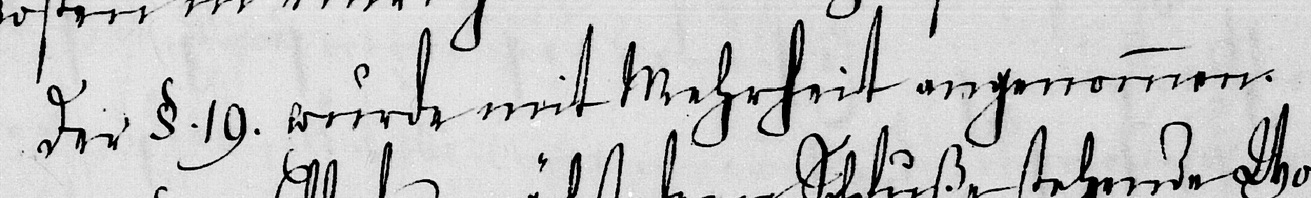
Der §. 19. wurde mit Mehrheit angenommen.
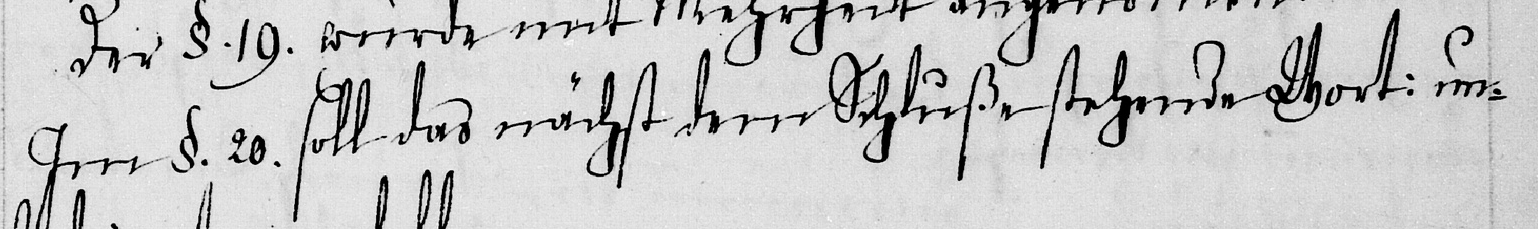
Im §. 20. soll das nächst dem Schluße stehende Wort: un¬
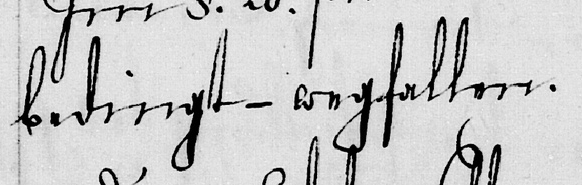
bedingt – wegfallen.
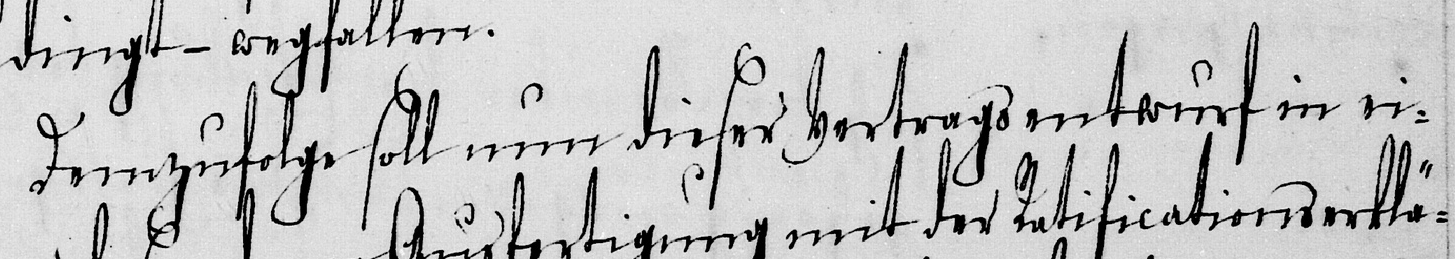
Demzufolge soll nun dieser Vertragsentwurf in ei¬
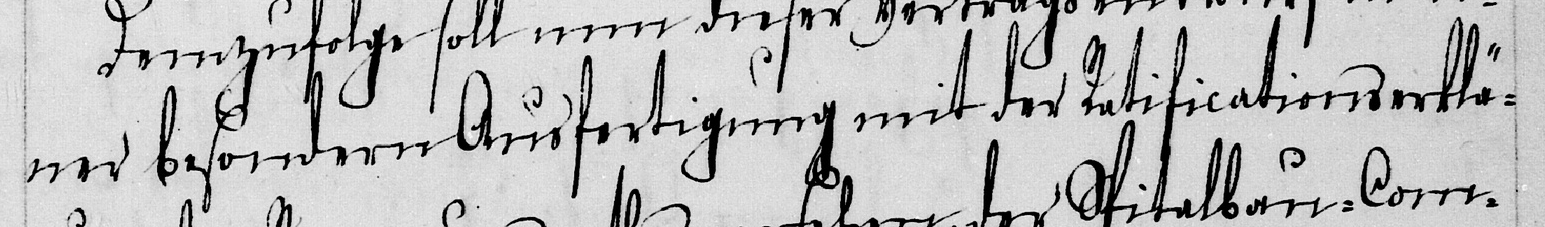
ner besondern Ausfertigung mit der Ratificationserklä¬
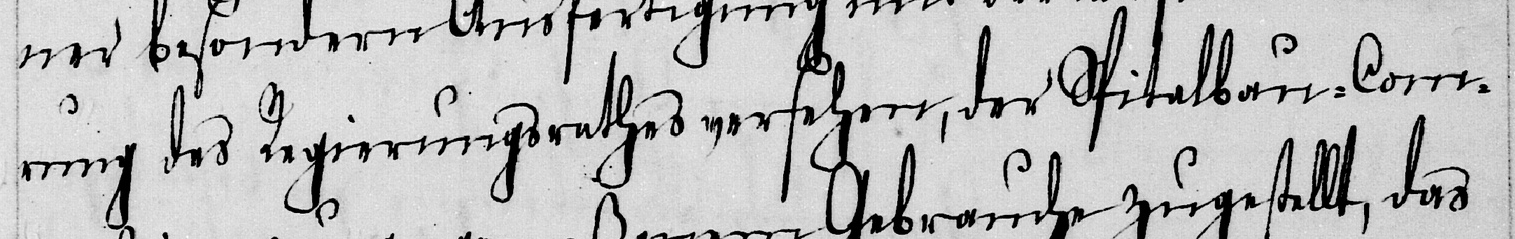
rung des Regierungsrathes versehen, der Spitalbau-Com¬
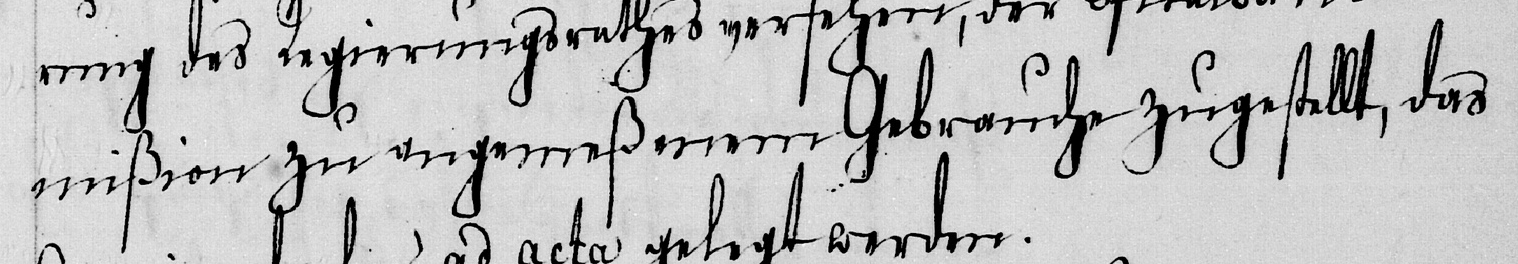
mißion zu angemeßenem Gebrauche zugestellt, das
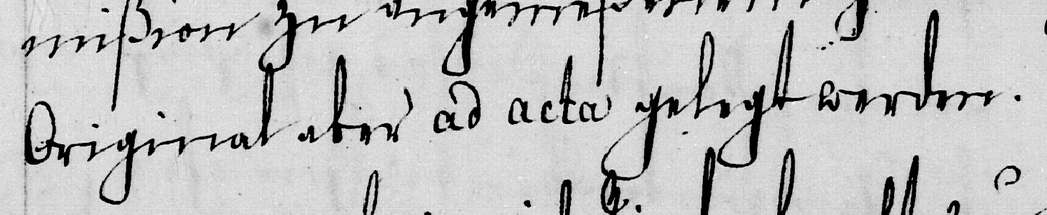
Original aber ad acta gelegt werden.
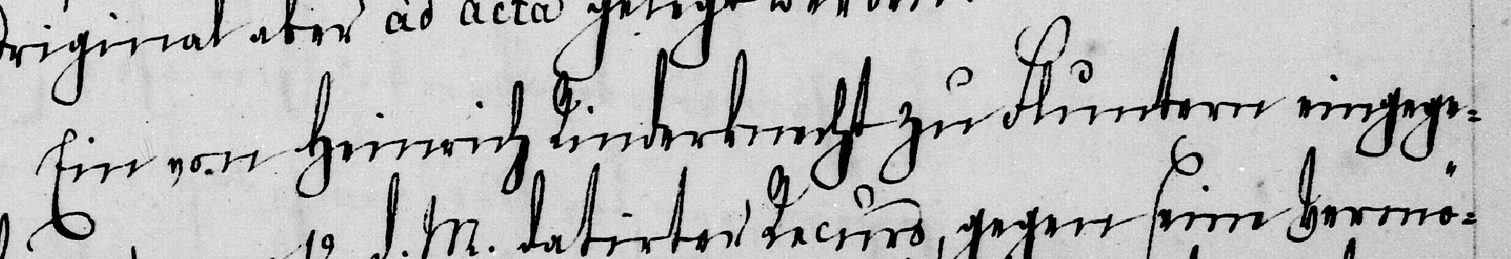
Ein von Heinrich Rinderknecht zu Fluntern eingege¬
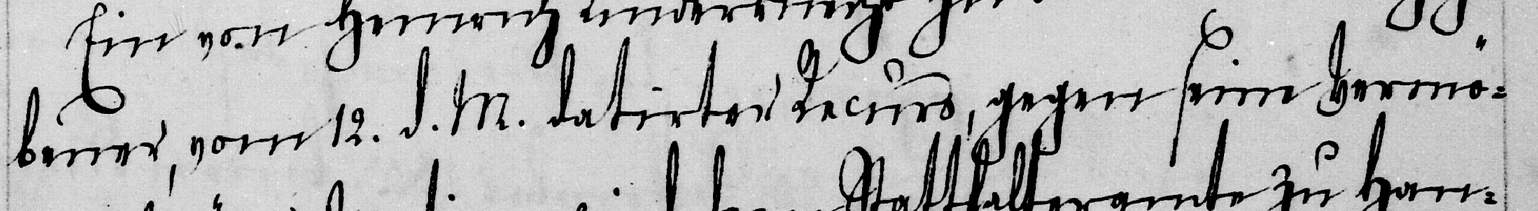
bener, vom 12. d. M. datirter Recurs, gegen seine Vermö¬
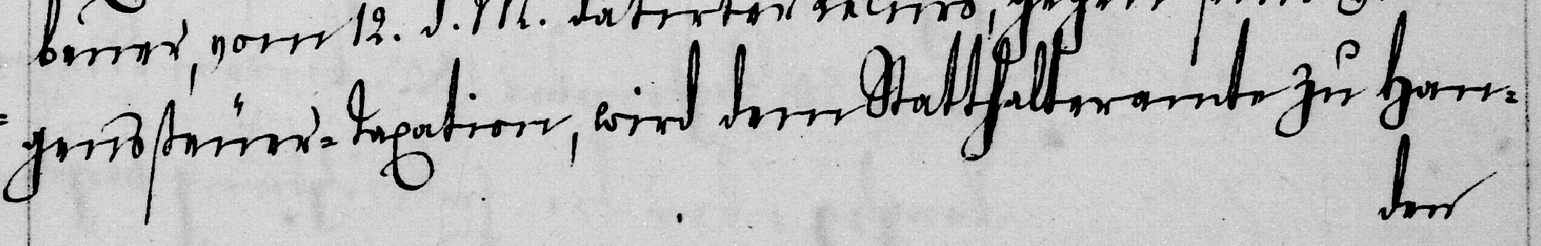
genssteuer-Taxation, wird dem Statthalteramte zu Han-
